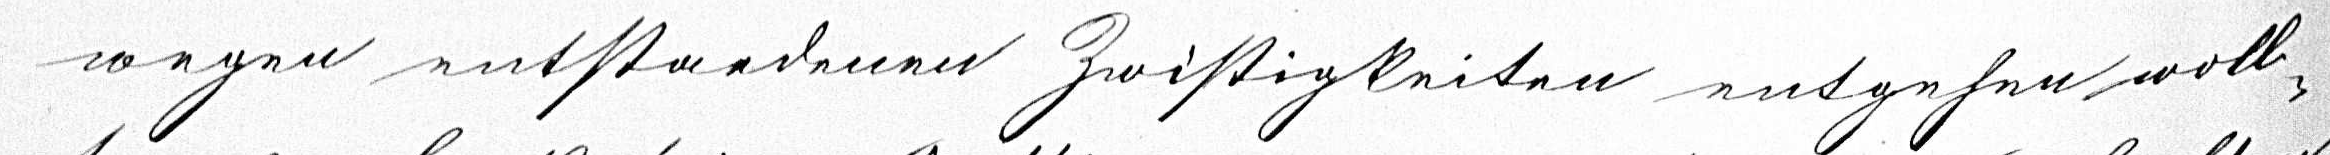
wegen entstandenen Zwistigkeiten entgehen woll¬
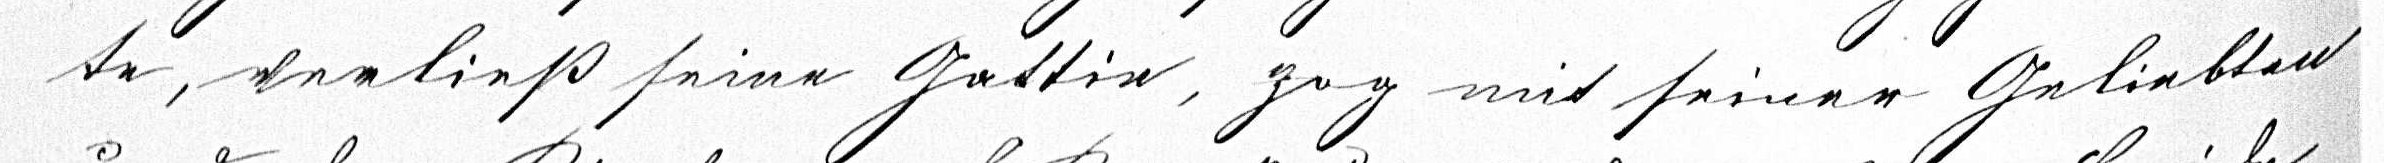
te, verließ seine Gattin, zog mit seiner Geliebten
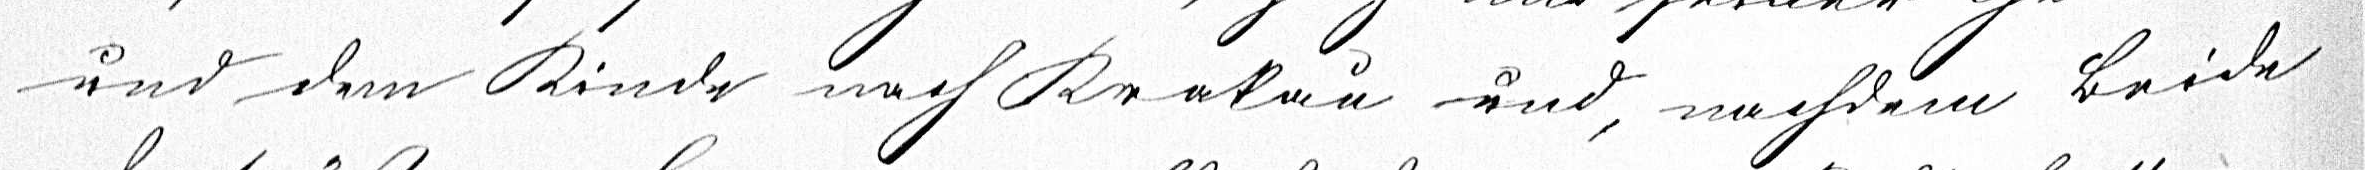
und dem Kinde nach Krakau und, nachdem Beide
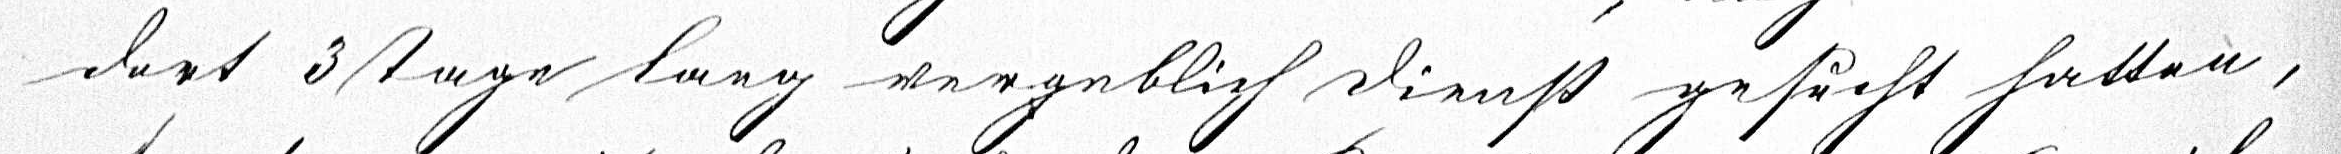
dort 3 Tage lang vergeblich Dienst gesucht hatten,
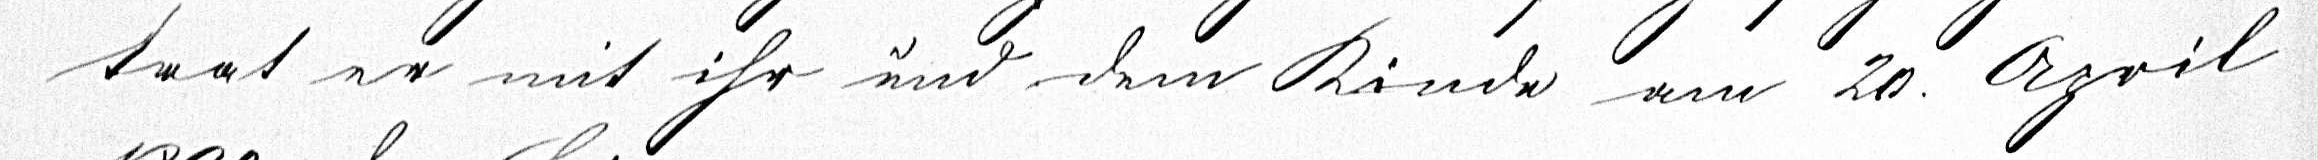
trat er mit ihr und dem Kinde am 20. April
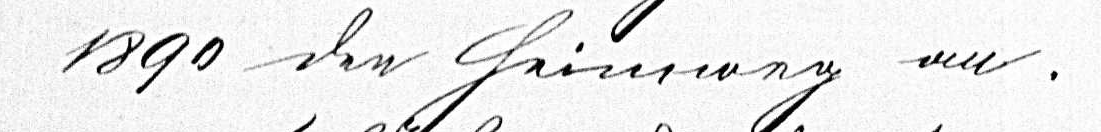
1890 den Heimweg an.
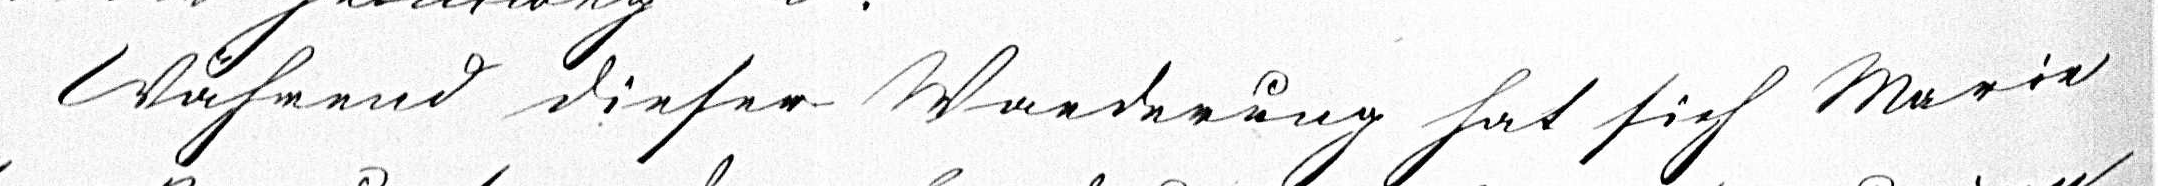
Während dieser Wanderung hat sich Marie
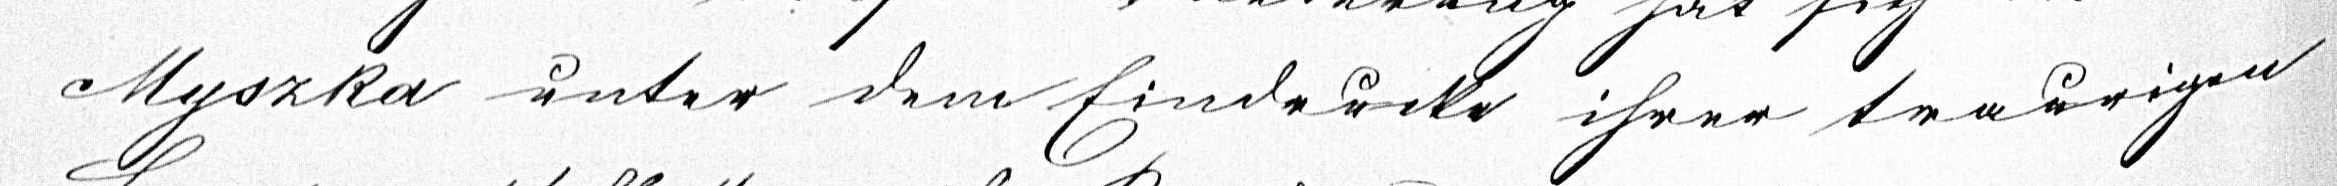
Myszka unter dem Eindrucke ihrer traurigen
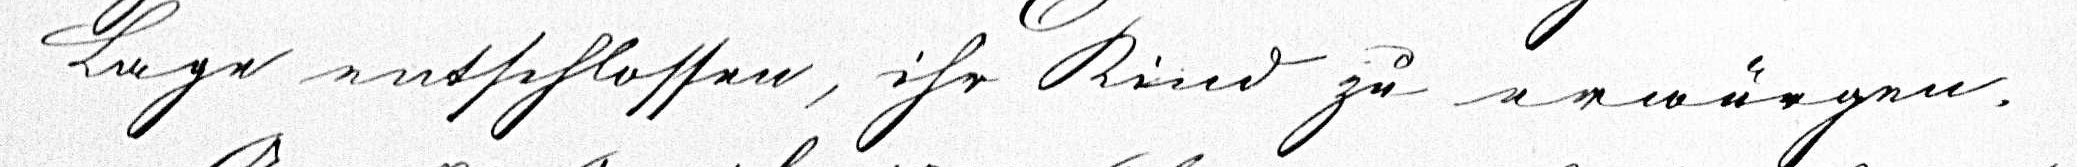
Lage entschlossen, ihr Kind zu erwürgen.
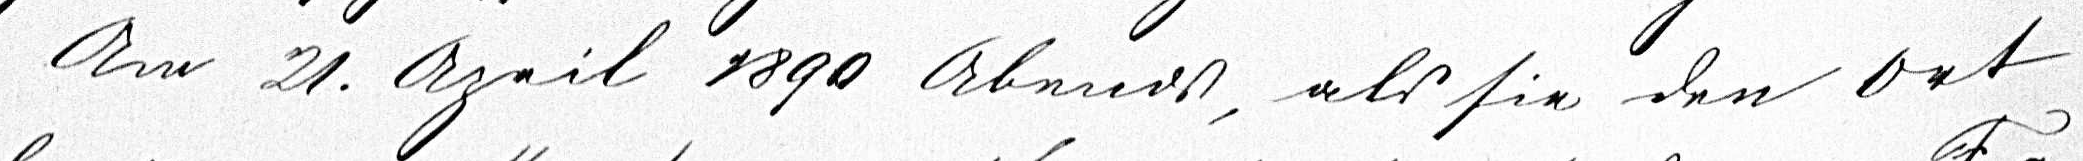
Am 21. April 1890 Abends, als sie den Ort
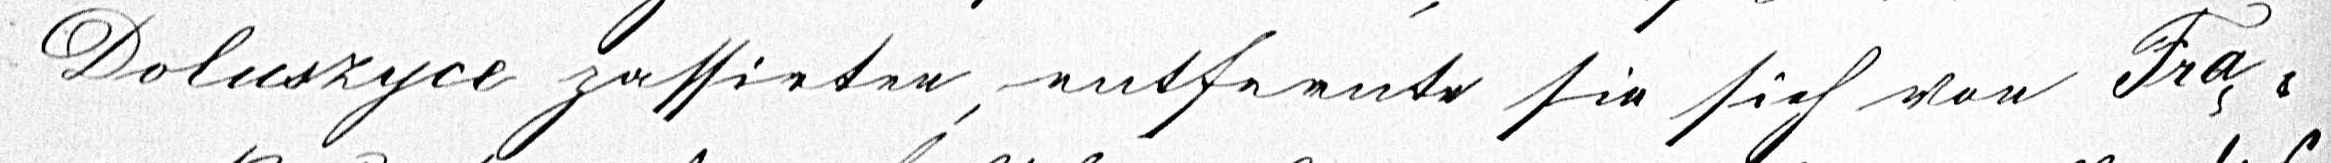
Doluszyce passirten, entfernte sie sich von Frą¬
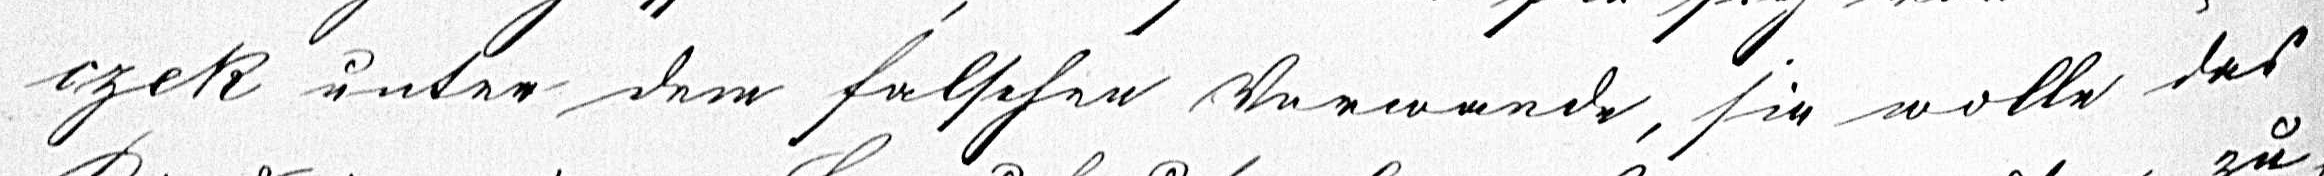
czek unter dem falsehen Vorwande, sie wolle das
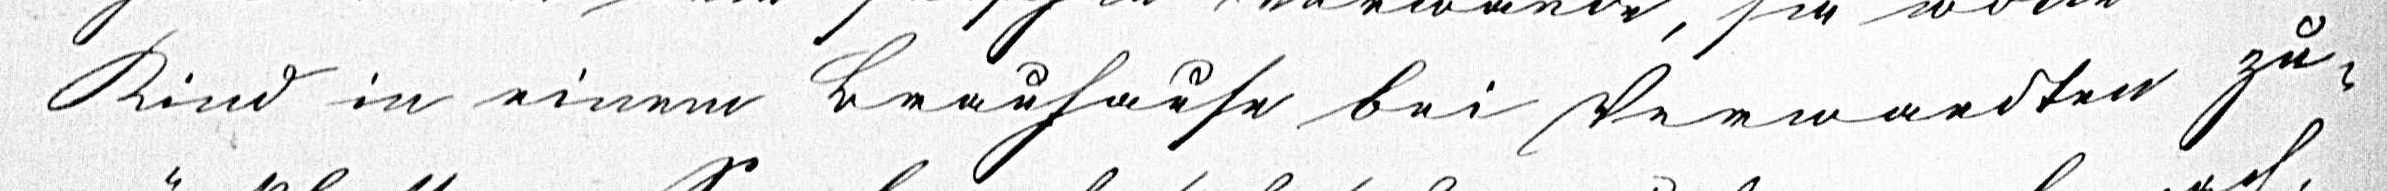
Kind in einem Brauhause bei Verwandten zu¬
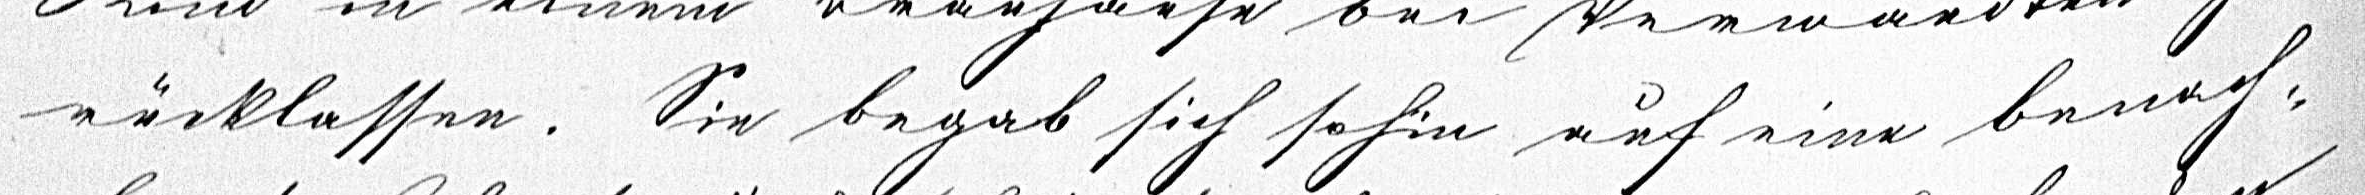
rücklassen. Sie begab sich sohin auf eine benach¬
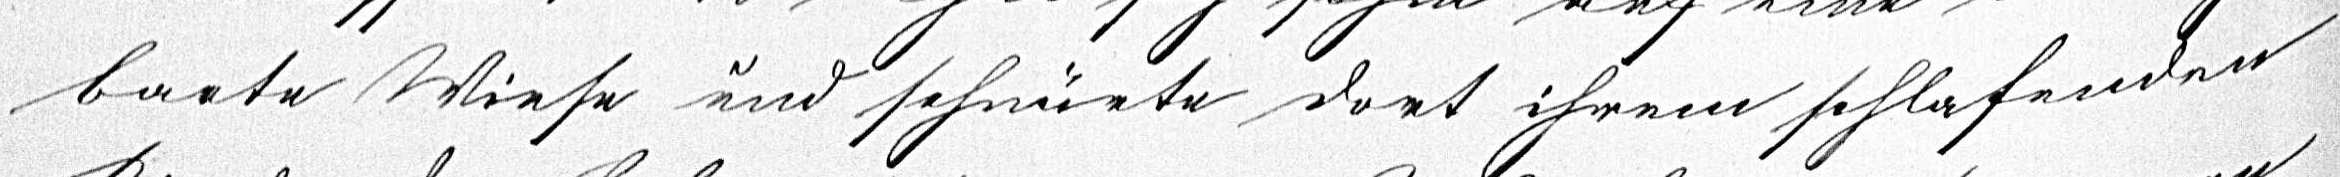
barte Wiese und schnürte dort ihrem schlafenden
